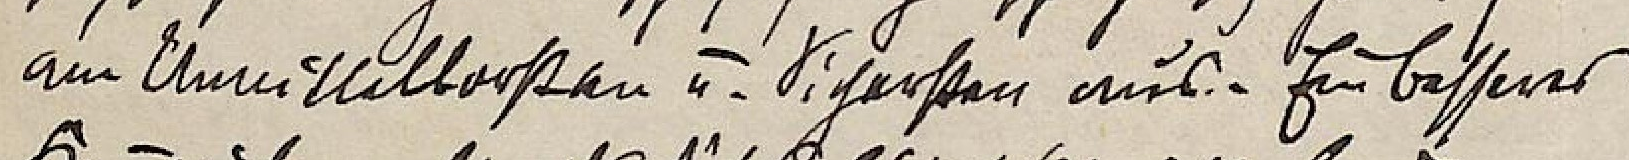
an Unmittelbarsten u. Sichersten aus. Ein besseres
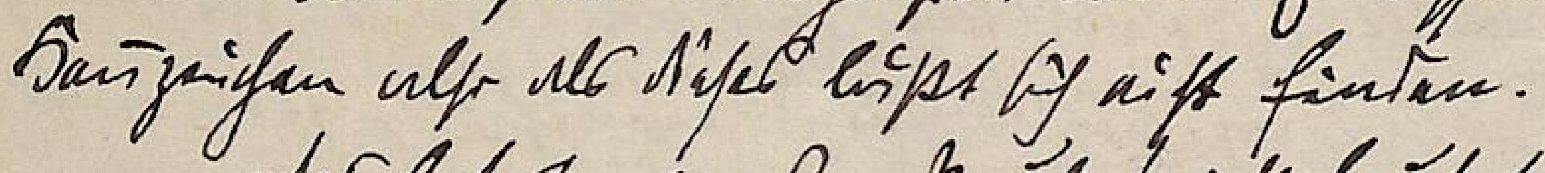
Kenzeichen also als dieses läßt sich nicht finden.
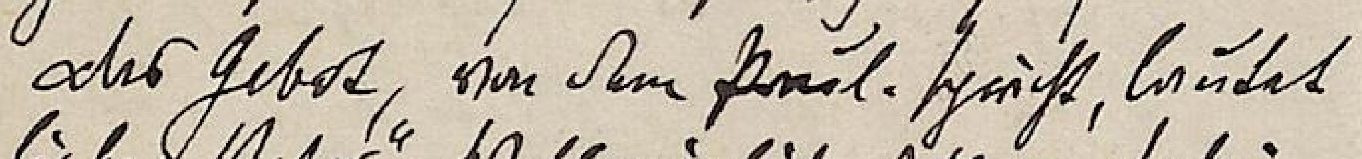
Das Gebet, von dem freut: spricht, lautet
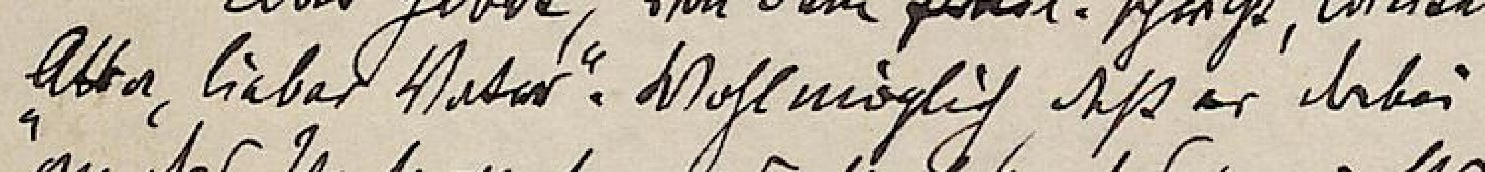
Abba, lieber Vater: Wohl möglich, das er dabei
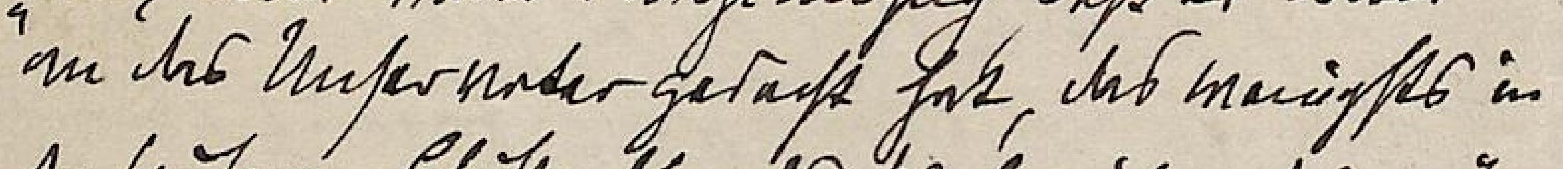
an das Unservater gedacht hat, das wenigsts in
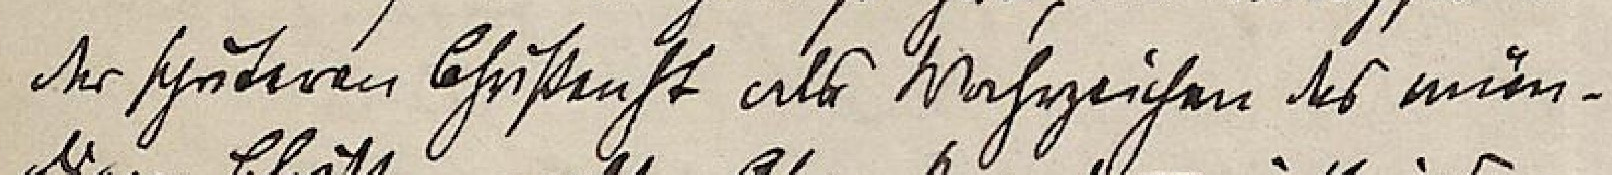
der späteren Christenht als Wahrzeichen des münd¬
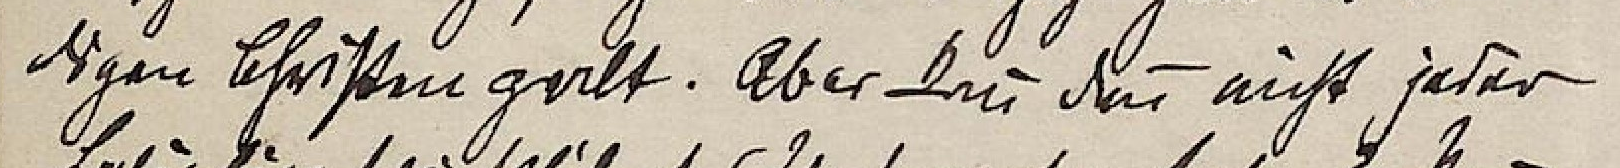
digen Christen galt. Aber kann denn nicht jeder
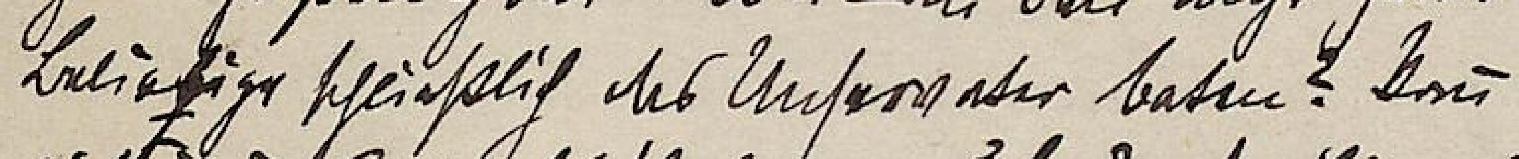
Beliebige schließlich das Unservater beten? kann
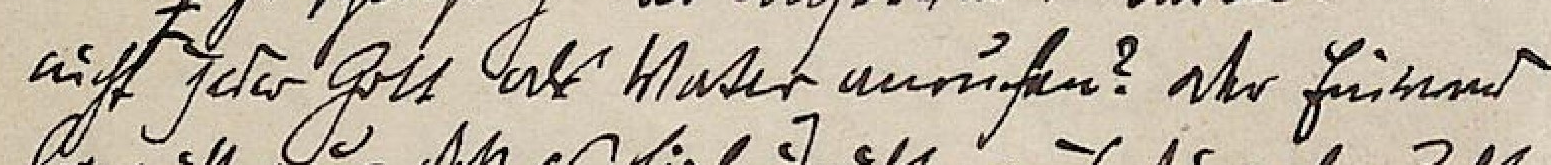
nicht jeder Gott als Vater anrufen? Der Einwand
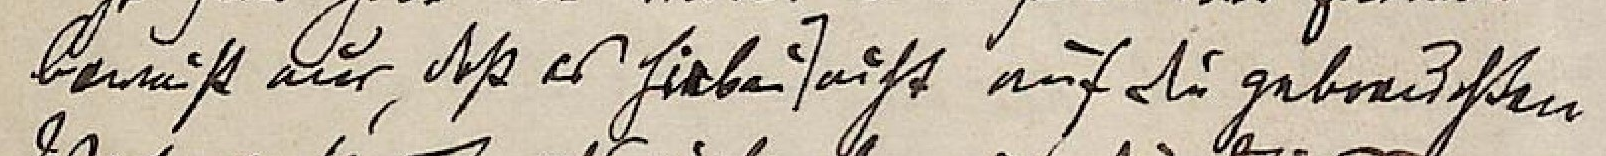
beweist nur, daß es hierbei ] nicht, auf die gebrauchten
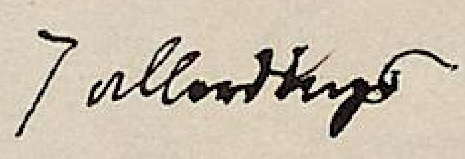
] allerdings
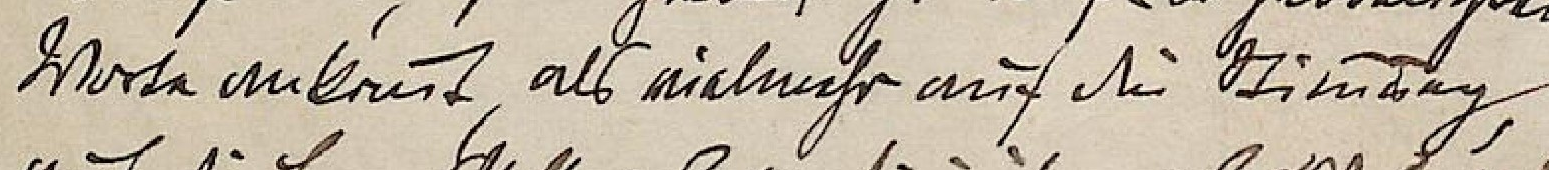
Worte ankomt als vielmehr auf die Stimmung,
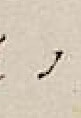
,
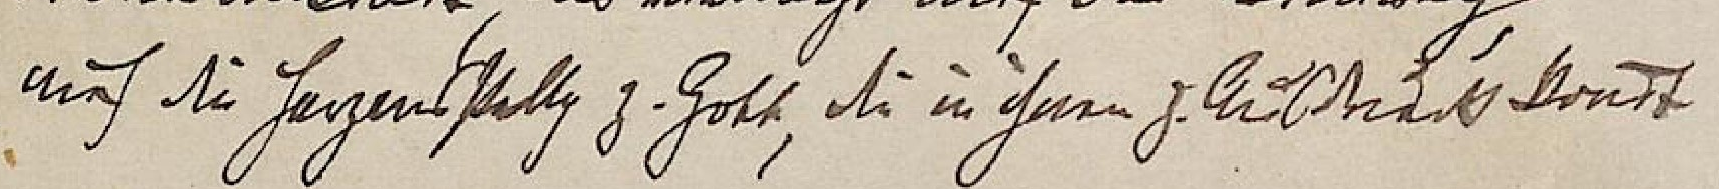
auf die Herzensstllg z. Gott die in ihnen z. Ausdruck kommt
